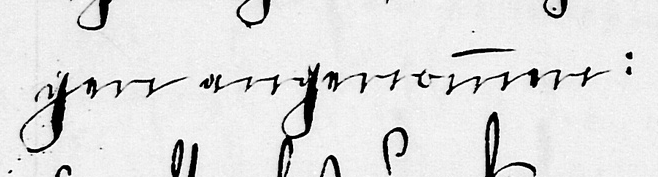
gen angenommen:
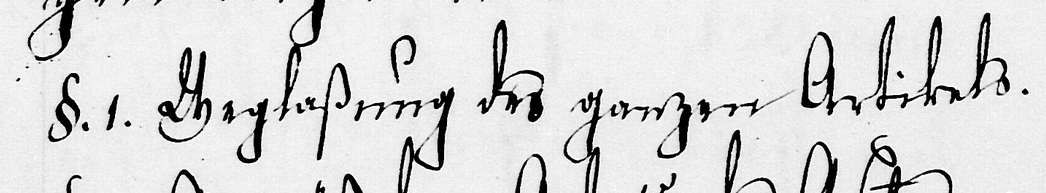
§. 1. Weglaßung des ganzen Artikels.
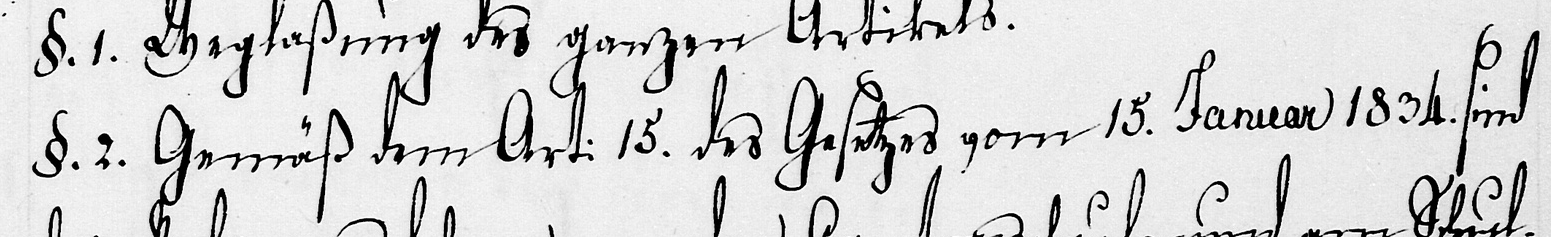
§. 2. Gemäß dem Art: 15. des Gesetzes vom 15. Januar 1834. sind
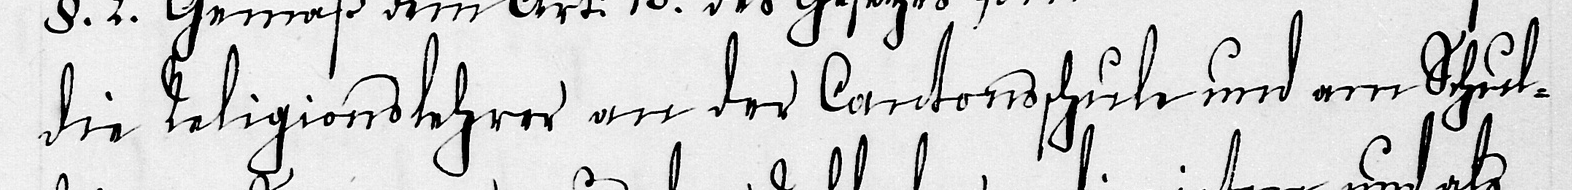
die Religionslehrer an der Cantonsschule und am Schul¬
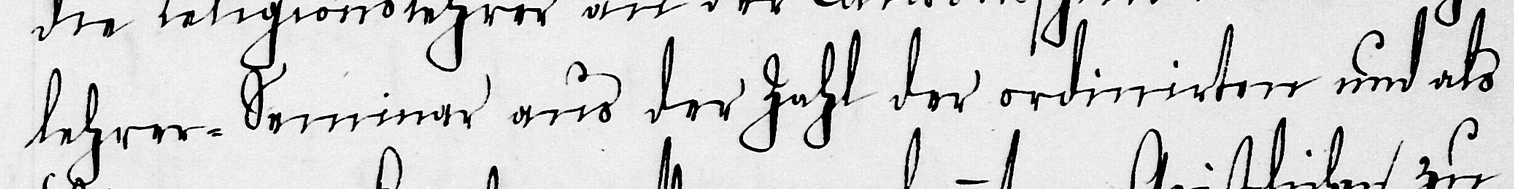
lehrer-Seminar aus der Zahl der ordinirten und als
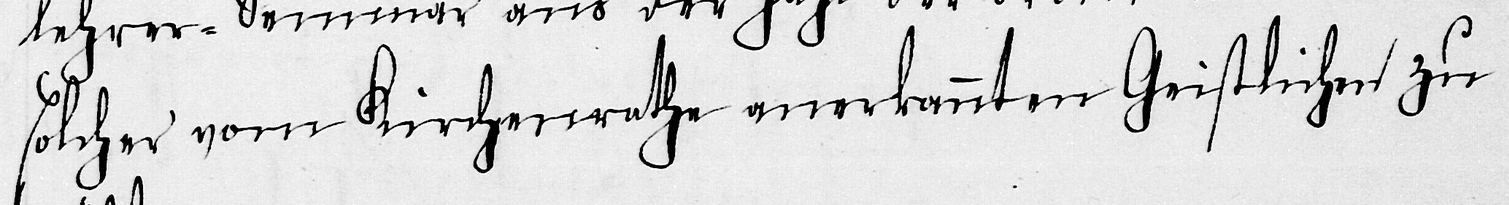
solcher vom Kirchenrathe anerkannten Geistlichen zu
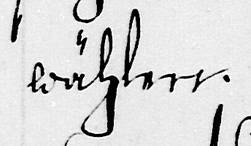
wählen.
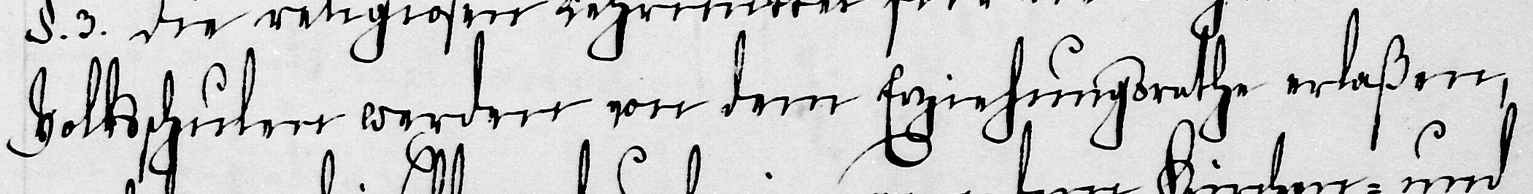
Volksschulen werden von dem Erziehungsrathe erlaßen,
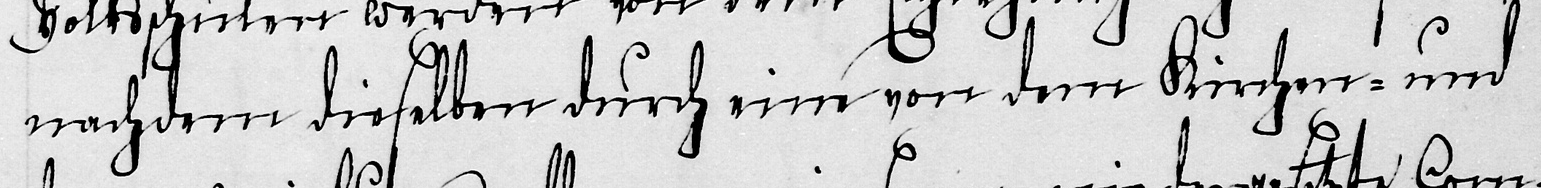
nachdem dieselben durch eine von dem Kirchen- und
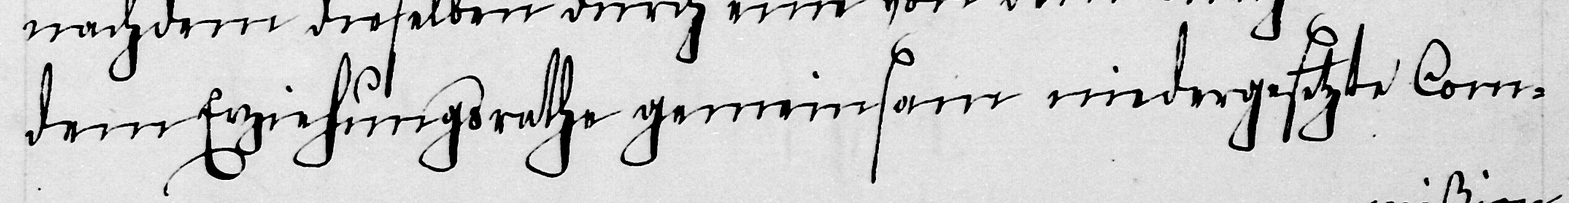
dem Erziehungsrathe gemeinsam niedergesetzte Com-
